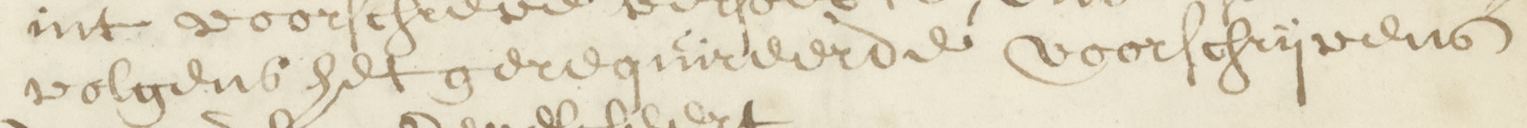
volgens het gerequireerde voorschrijvens
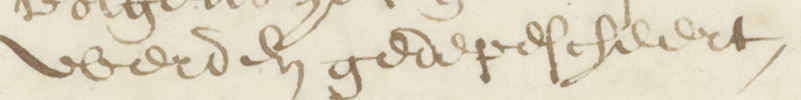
werden gedepescheert.
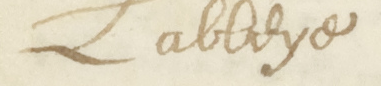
Labbye
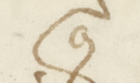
Ca.
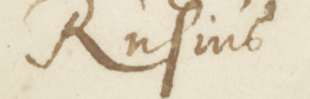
Rusius
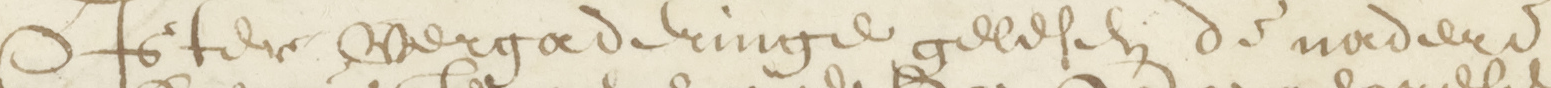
Is ter Vergaderinge gelesen de nadere
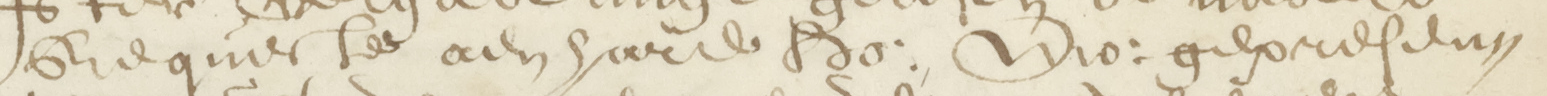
Requeste aen hare Ho:Mo: gepresen„
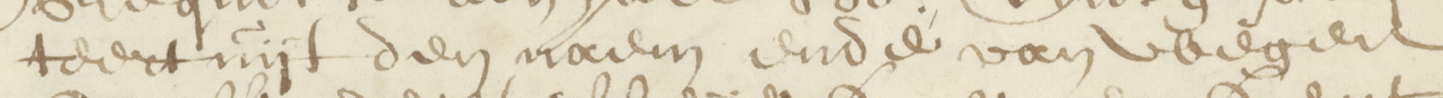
teert uijt den naem ende van wegen
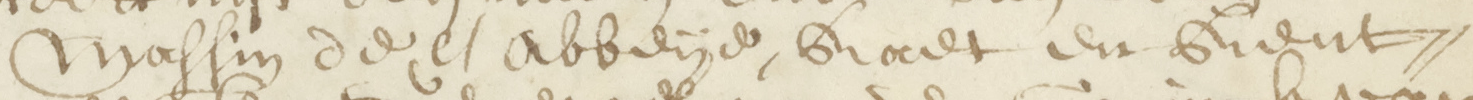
Massin de l‛Abbeije, Raet en Rent„
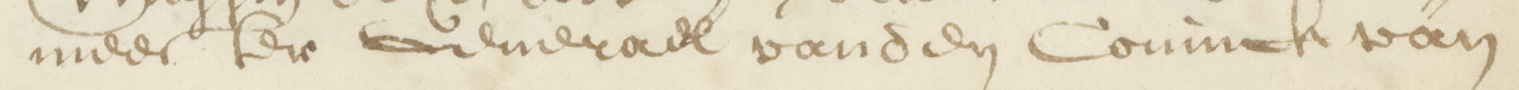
meester Generael vanden Coninck van
